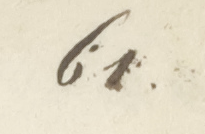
61.
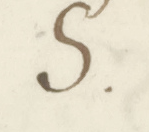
S.
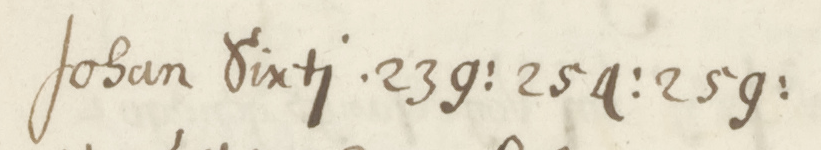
Johan Sixti. 239: 254: 259:
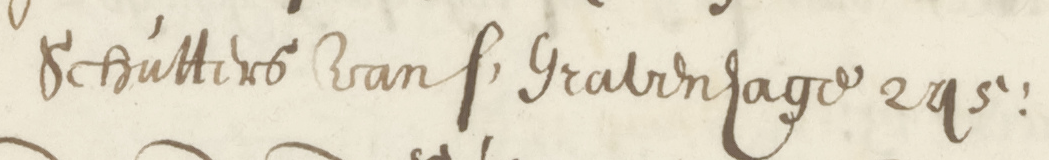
Schutters van s' Gravenhage 245:
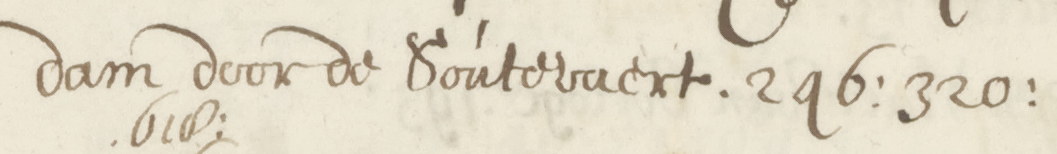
dam door de Soutevaert. 246: 320:
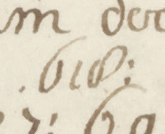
618:
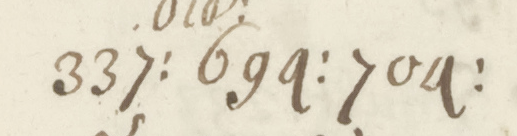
337: 694: 704:
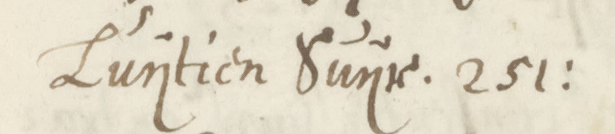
Luijtien Suijr. 251:
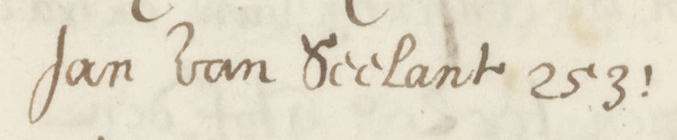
Jan van Seelant 253:
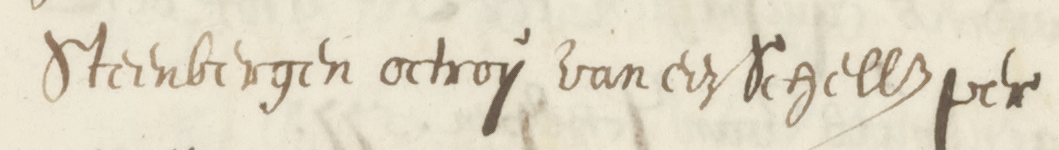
Steenbergen octroij van een schellen per
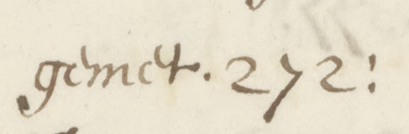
gemet. 272:
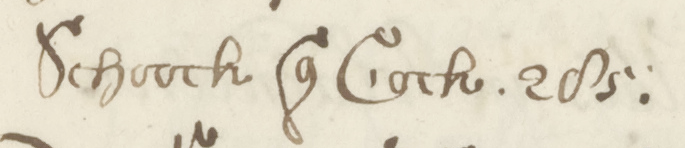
Schoock Ca. Cock. 285:
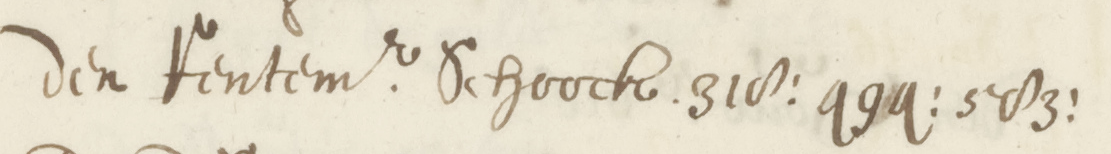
den Rentemr. Schoock. 318: 494: 583:
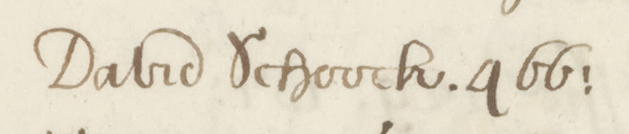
David Schoock. 466:
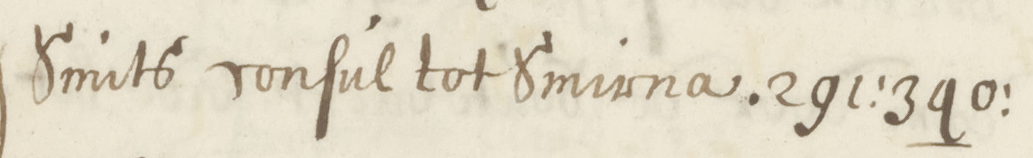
Smits consul tot Smirna. 291: 340:
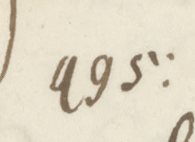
495:
